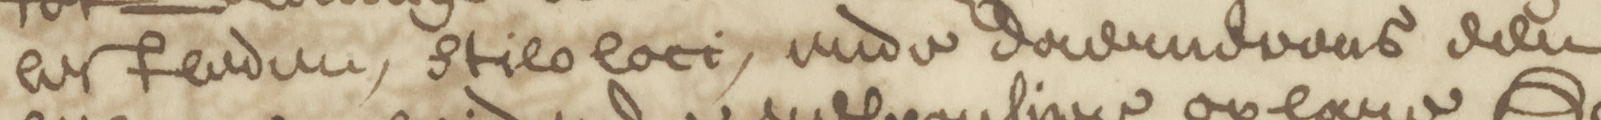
lestleden, stilo loci, ende daernevens een
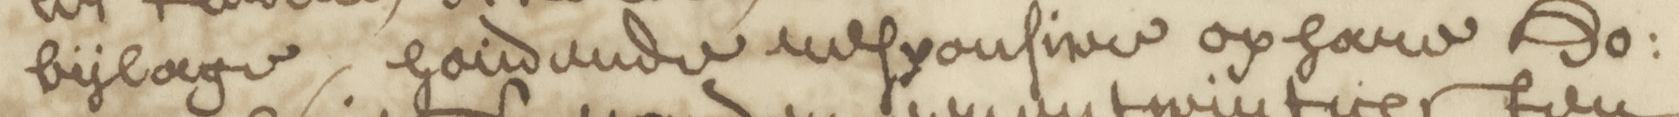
bijlage, houdende responsive op hare Ho:
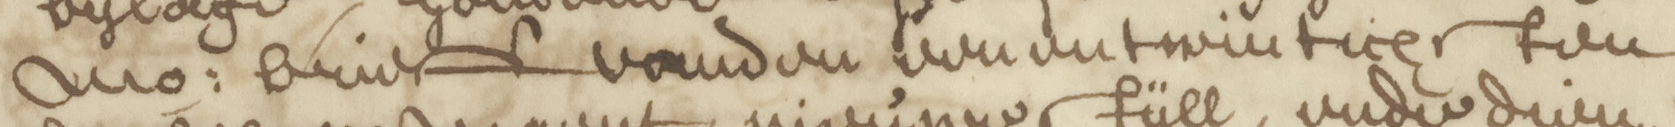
Mo: brieff vanden eenentwintichsten
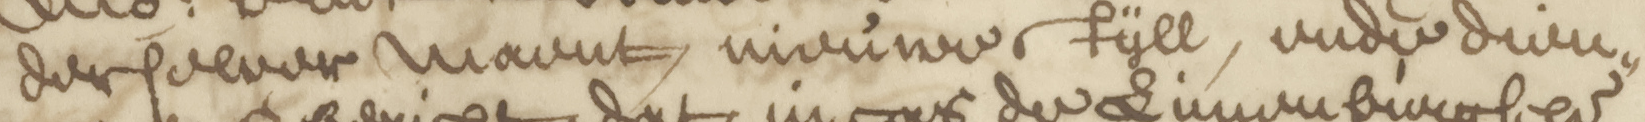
derselver maent, nieuwe stijll, ende dien,,
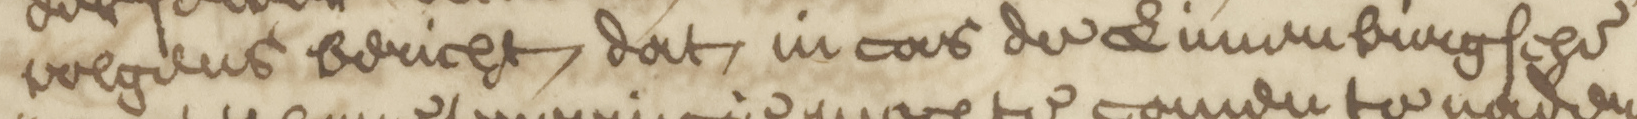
„volgens bericht, dat, in cas de Lunenburgsche
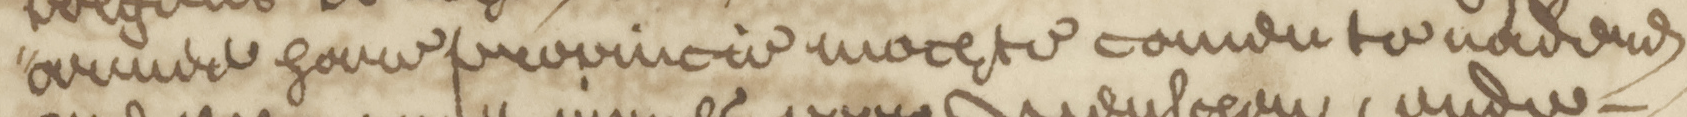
armee hare provincie mochte comen te naderen
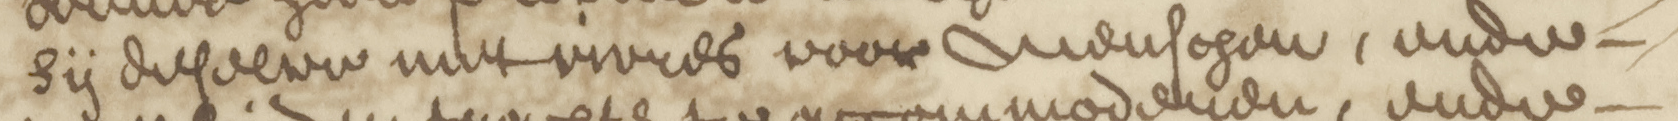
sij deselve met vivres voor Menschen, ende —
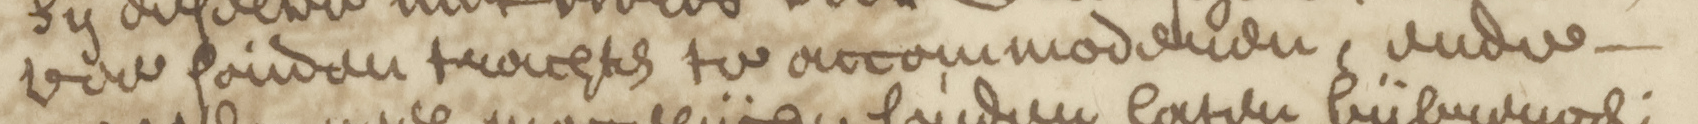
vee souden trachten te accommoderen, ende —
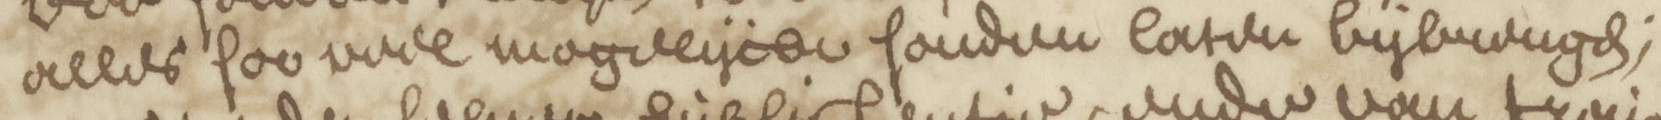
alles soo veel mogelijck souden laten bijbrengen;
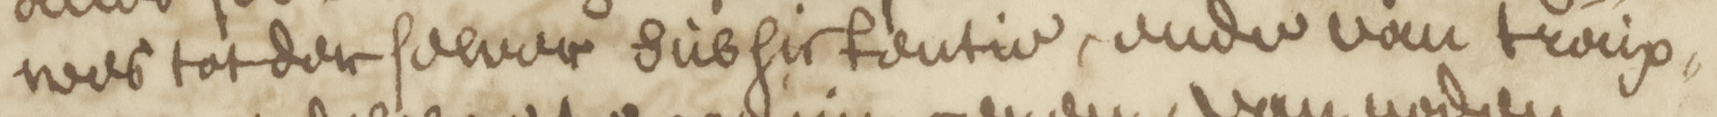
wes tot derselver subsistentie, ende van troup,,
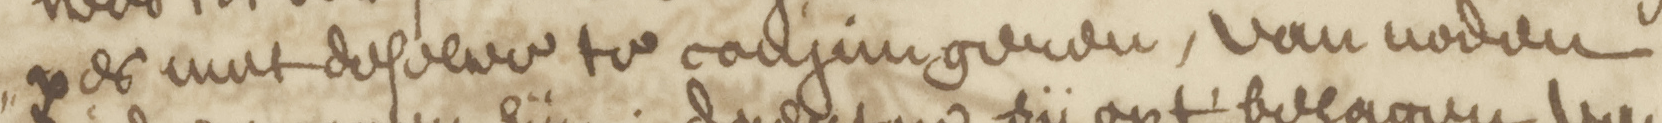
„pes met deselve te conjungeren, van noden
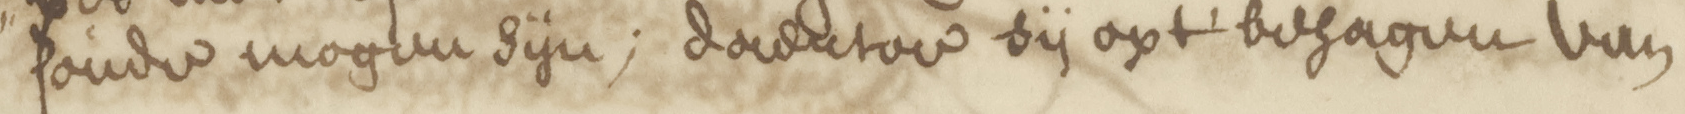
soude mogen sijn; daertoe bij opt' behagen van
